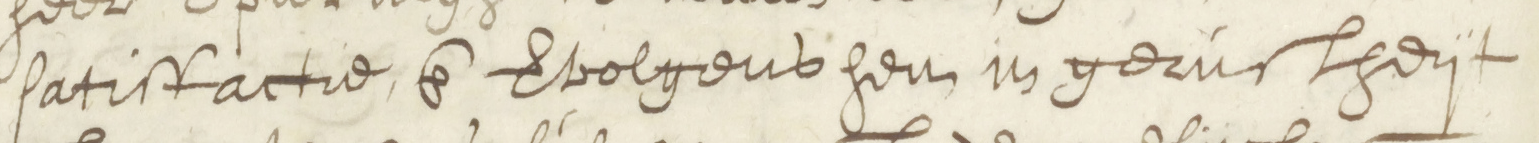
satisfactie, & vvolgens hem in gerustheijt
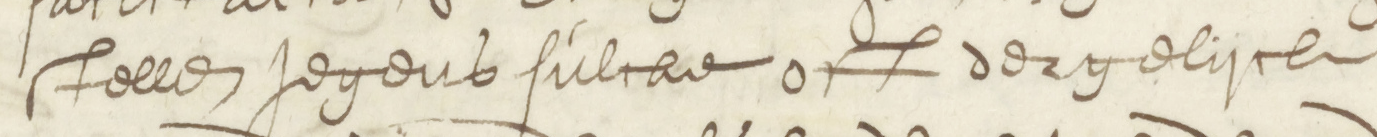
stellen Jegens sulcke off dergelijck
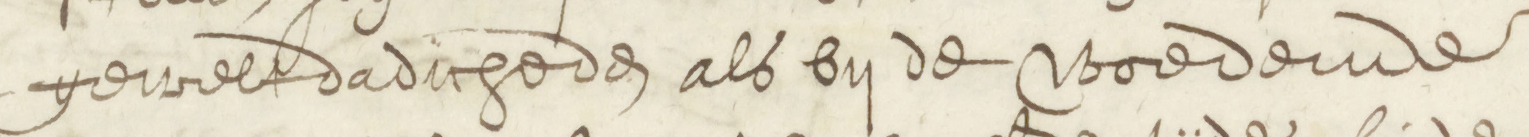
geweltdadicheden als by de woedende
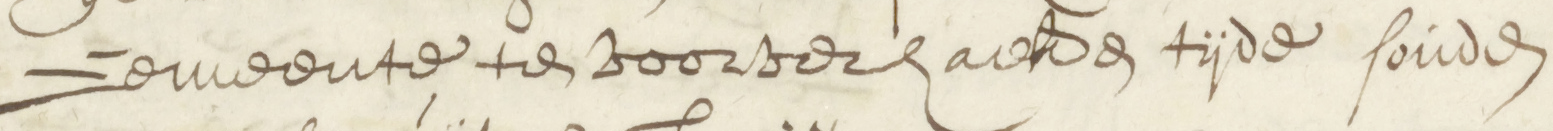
Gemeente ten voorverhaelden tijde souden
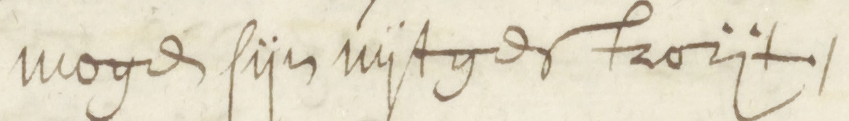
mogen sijn uijtgestroijt.
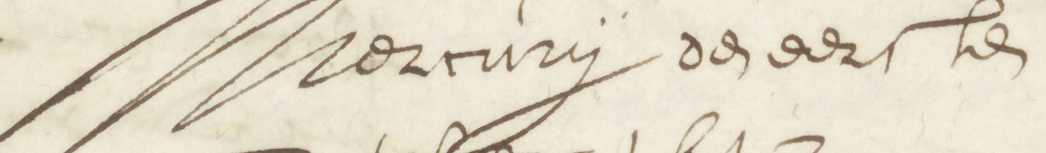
Mercurij den eersten
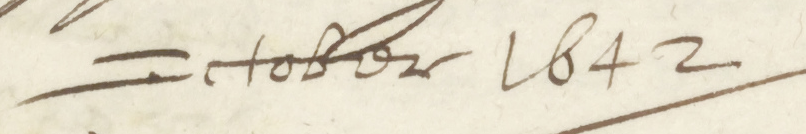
October 1642
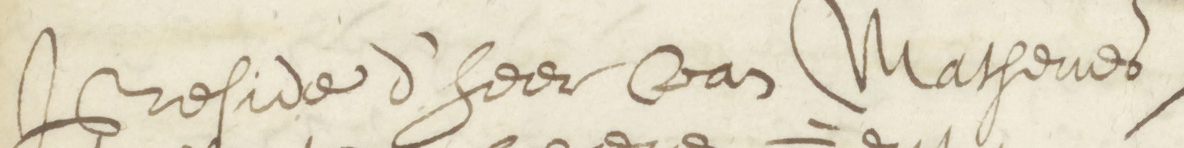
Peside d'heer van Mathenes
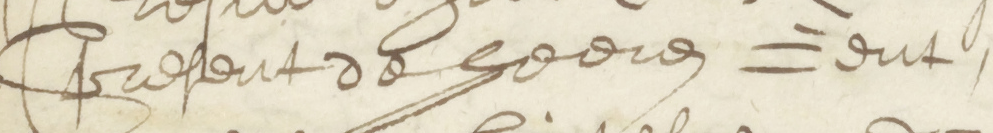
Present de heeren Gent,
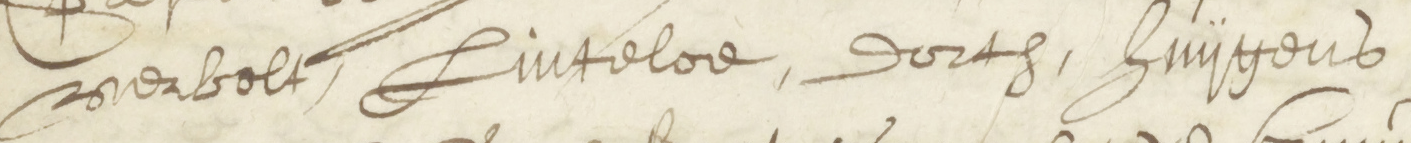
Verbolt, Linteloe, Dorth, Huijgens
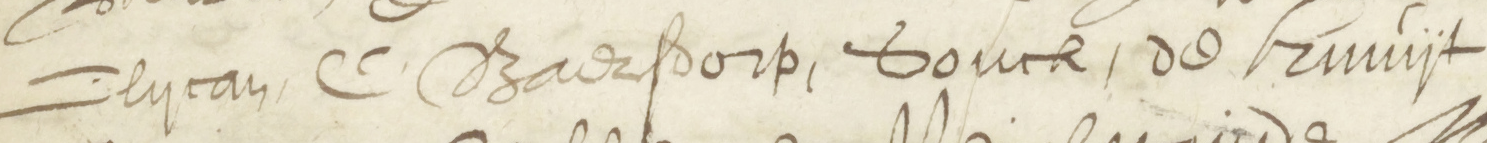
Olycan, C. Baersdorp, Sonck, de Knuijt,
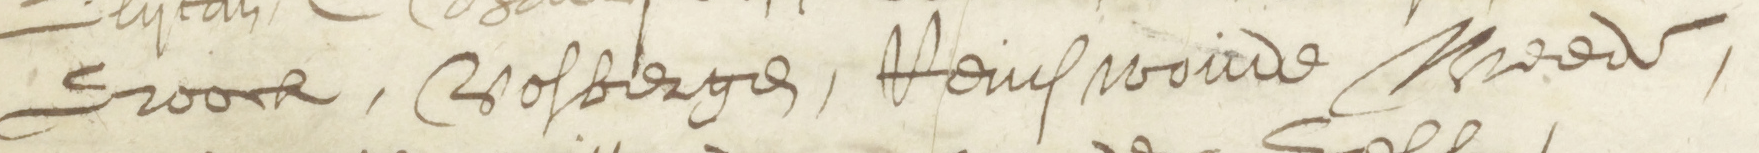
Croock, Vosbergen, Reinswoude Weede,
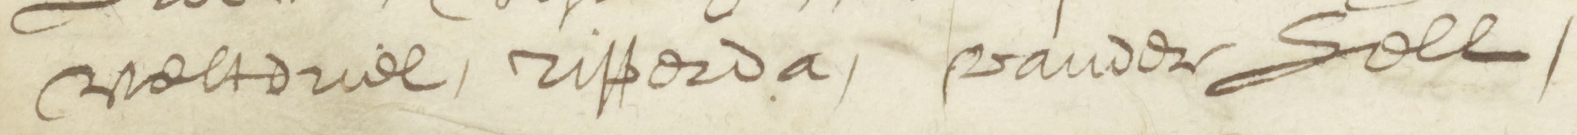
Veltdriel, ripperda, vander Hell,
